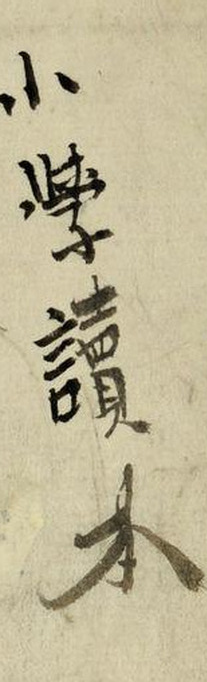小学読本
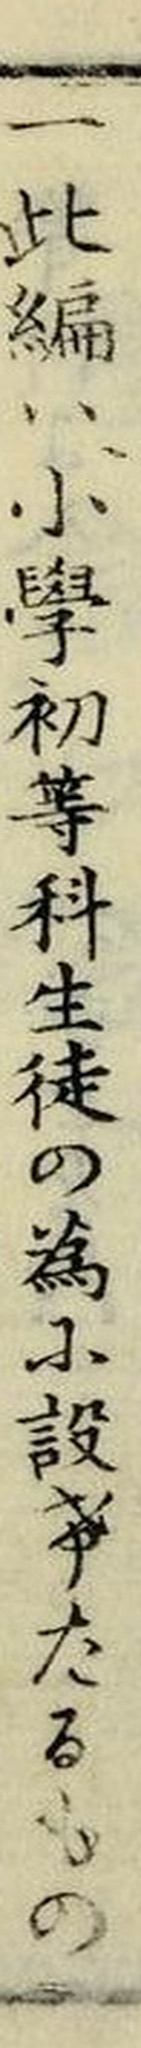一此編は、小学初等科生徒の為に設けたるもの
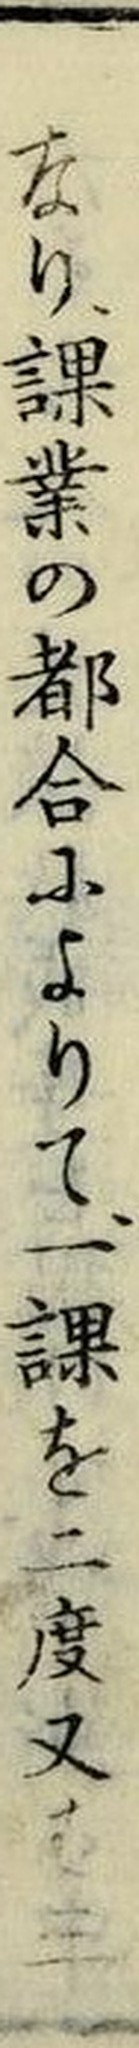なり、課業の都合によりて、一課を二度又は三
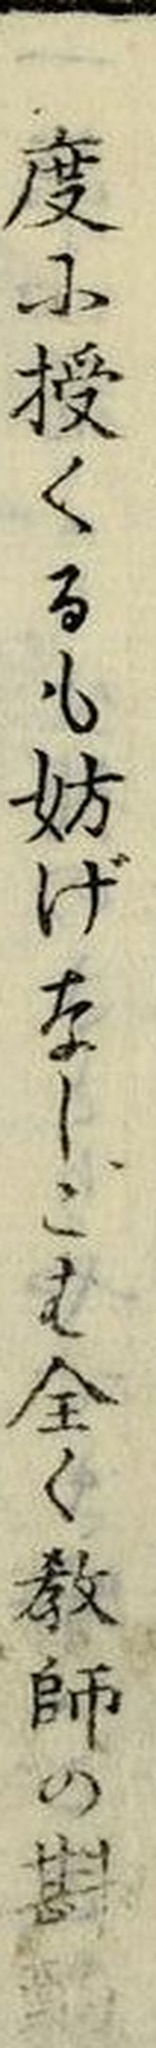度に授くるも妨げなし、こは全く教師の斟酌
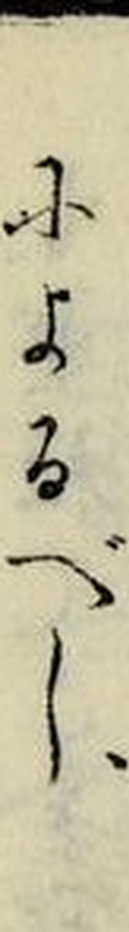によるべし、
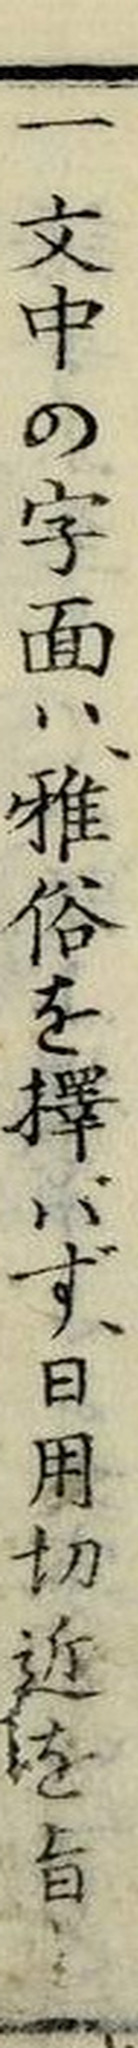一文中の字面は、雅俗を択ばず、日用切近を旨と
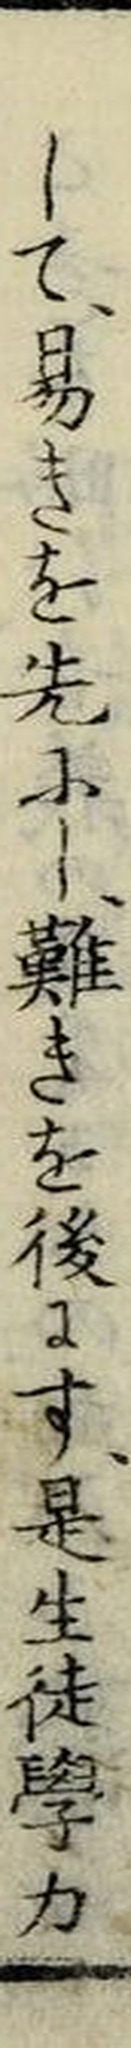して、易きを先にし、難きを後にす、是生徒学力
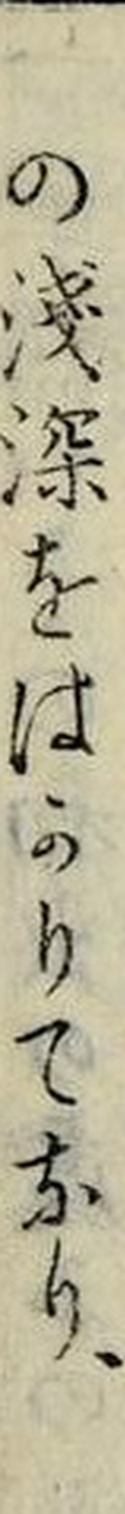の浅深をはかりてなり、
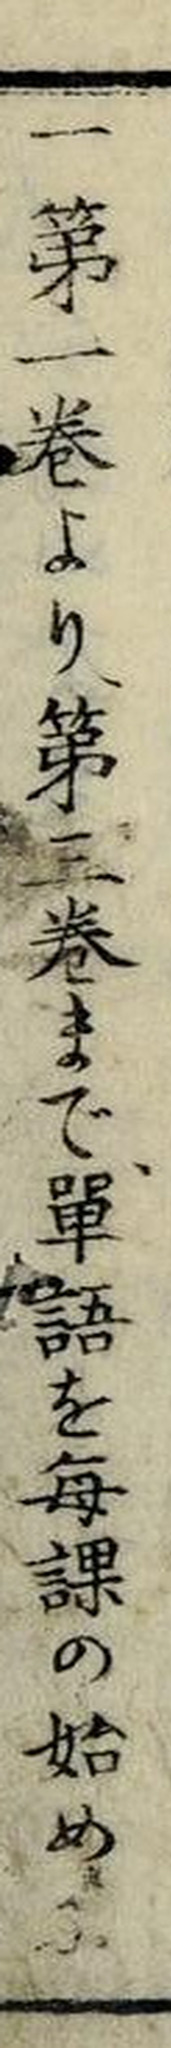一第一巻より、第三巻まで、単語を毎課の始めに
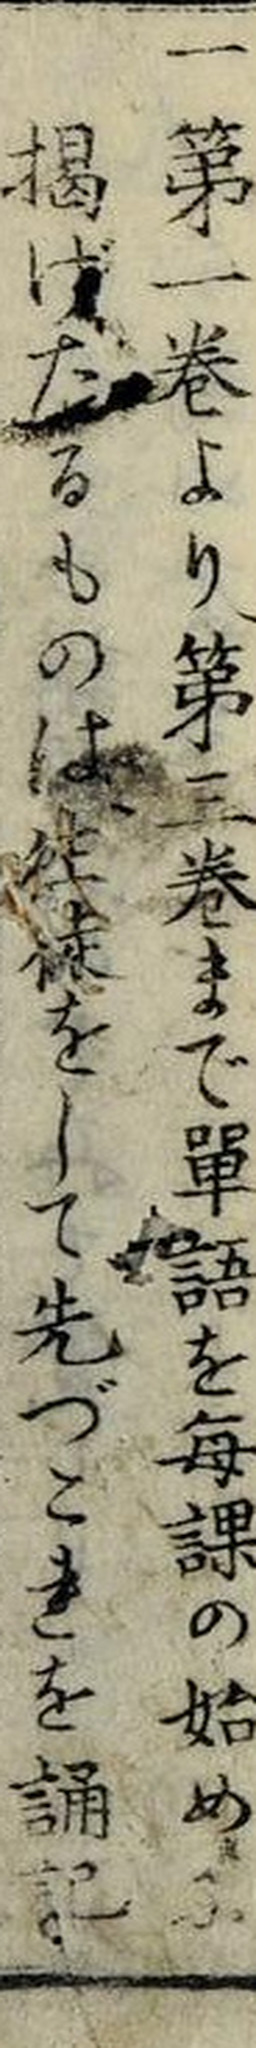揚げたるものは、生徒をして先づこれを誦記

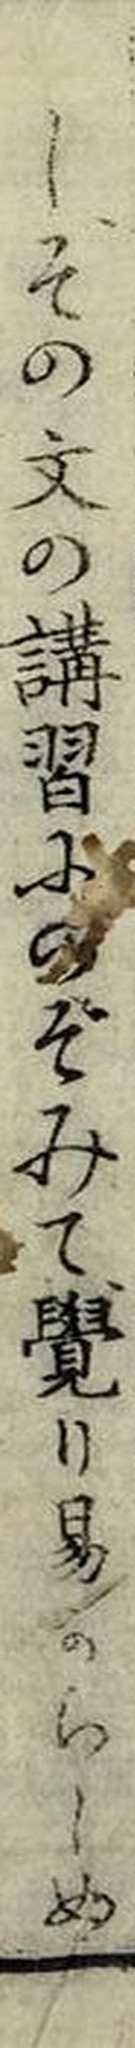し、その文の講習にのぞみて、覚り易からしめ
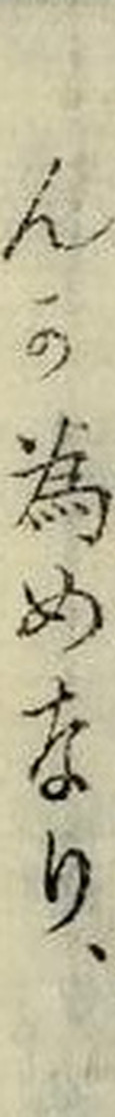んか為めなり、
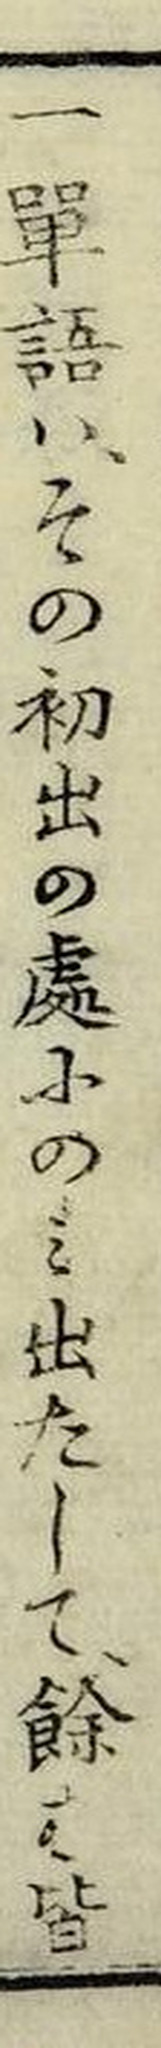一単語は、その初出の処にのみ出たして、余は皆
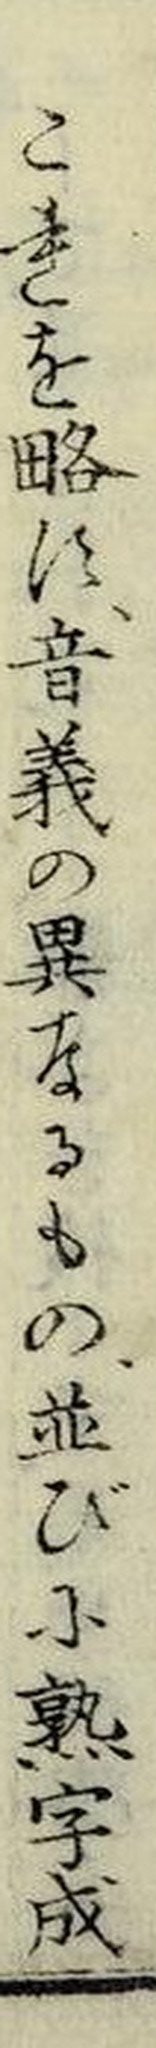これを略す、音義の異なるもの、並びに熟字成
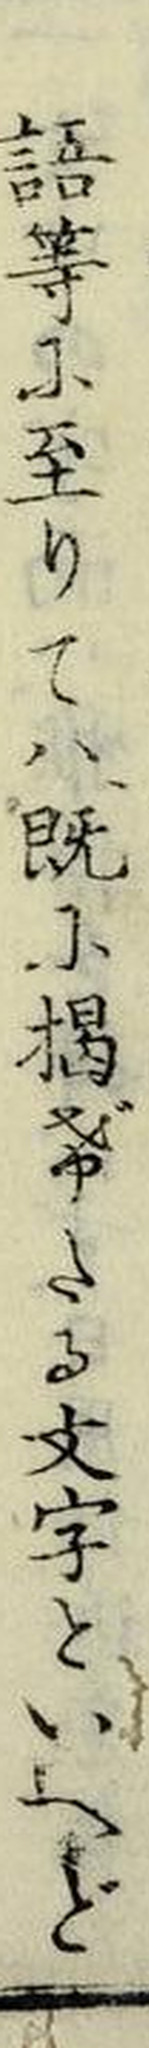語等に至りては、既に掲げたる文字といへど
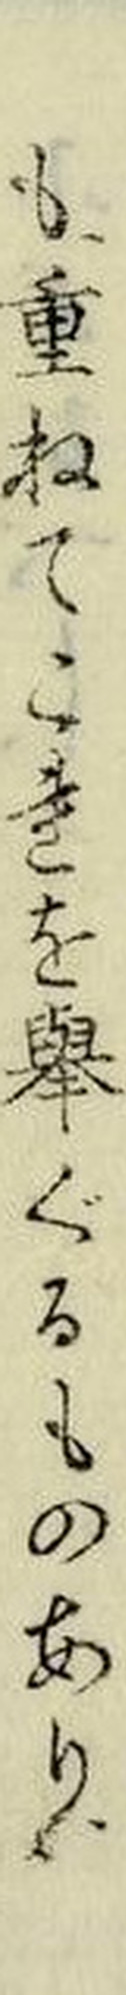も、重ねてこれを挙ぐるものあり、
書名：小学読本 初等科 巻一
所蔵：福井県文書館 Fukui Prefectural Archives
